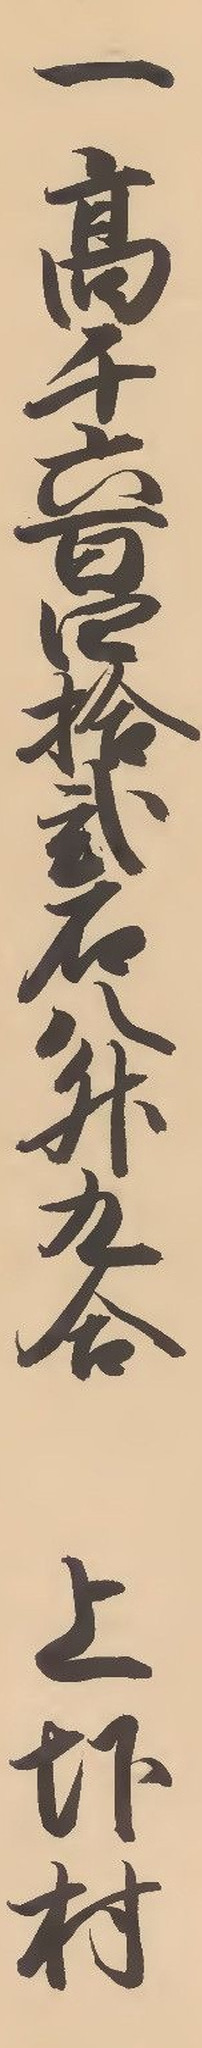一高千六百四拾弐石八升九合上圷村

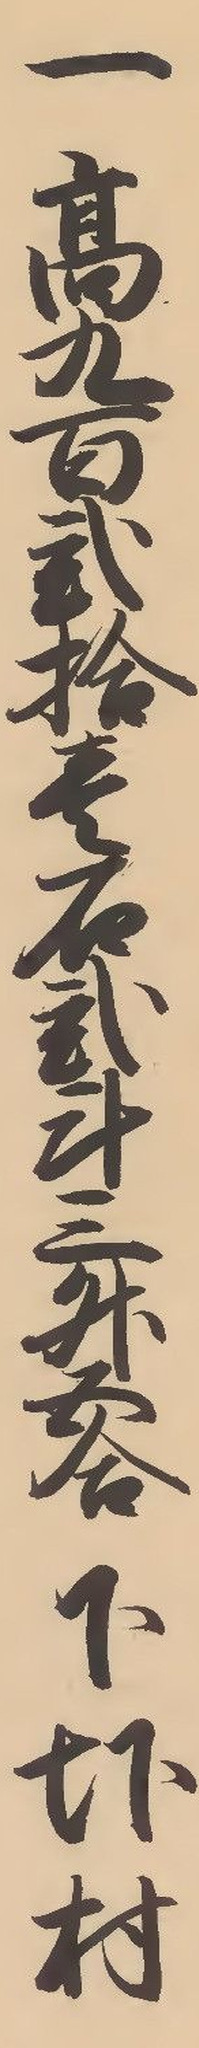一高九百弐拾壱石弐斗三升五合下圷村
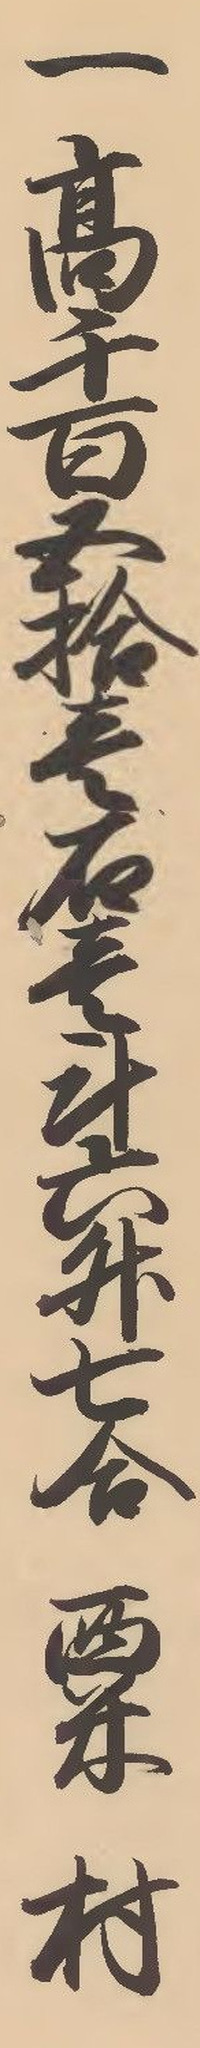一高千百五拾壱石壱斗六升七合粟村
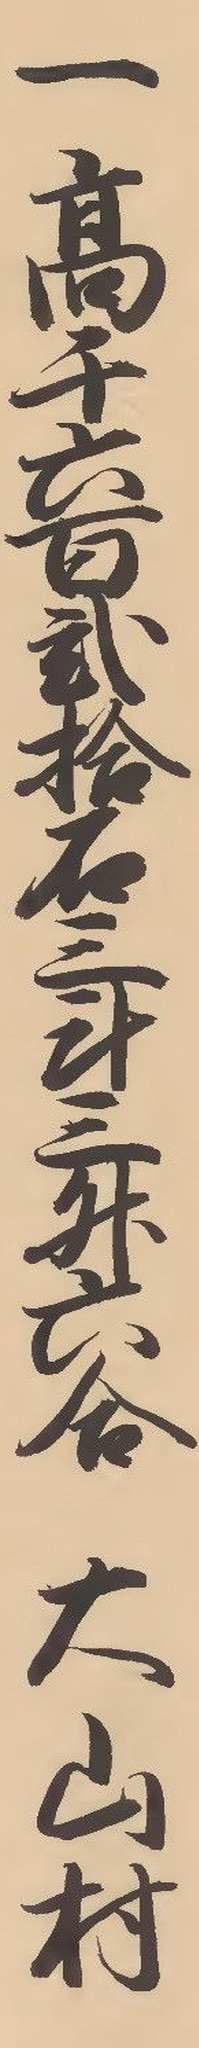一高千六百弐拾石三斗三升六合大山村
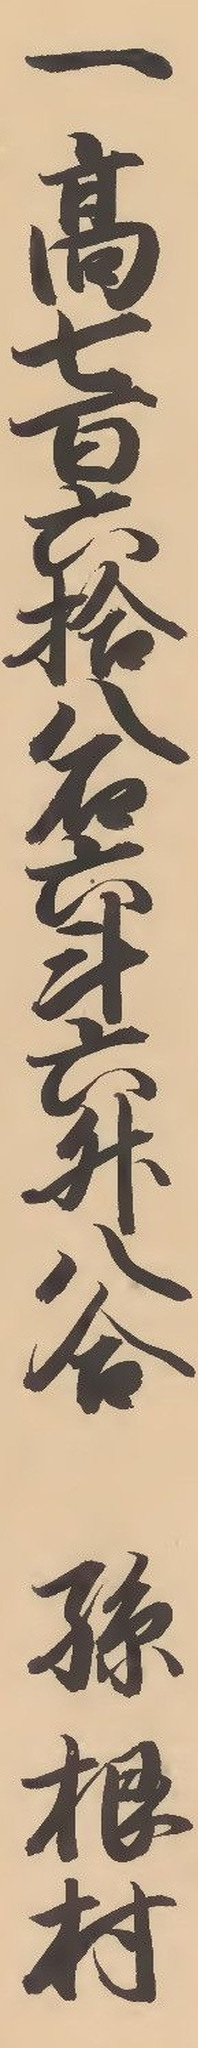一高七百六拾八石六斗六升八合孫根村
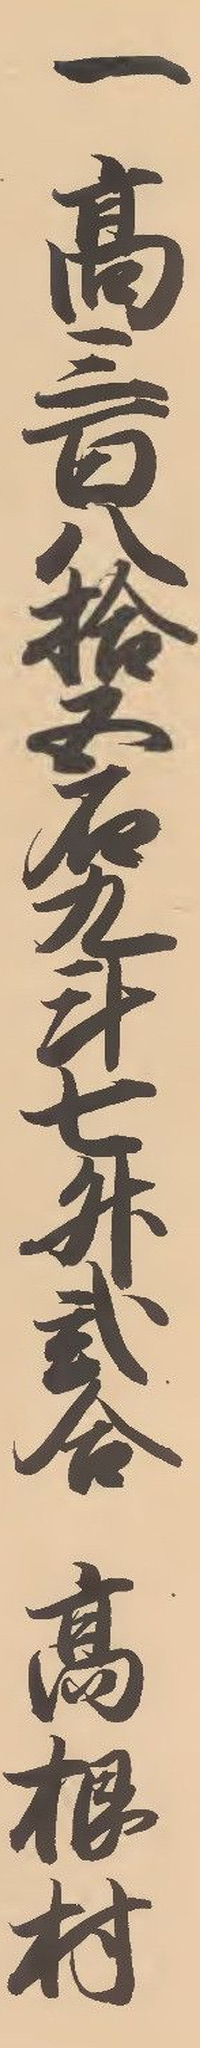一高三百八拾五石九斗七升弐合高根村
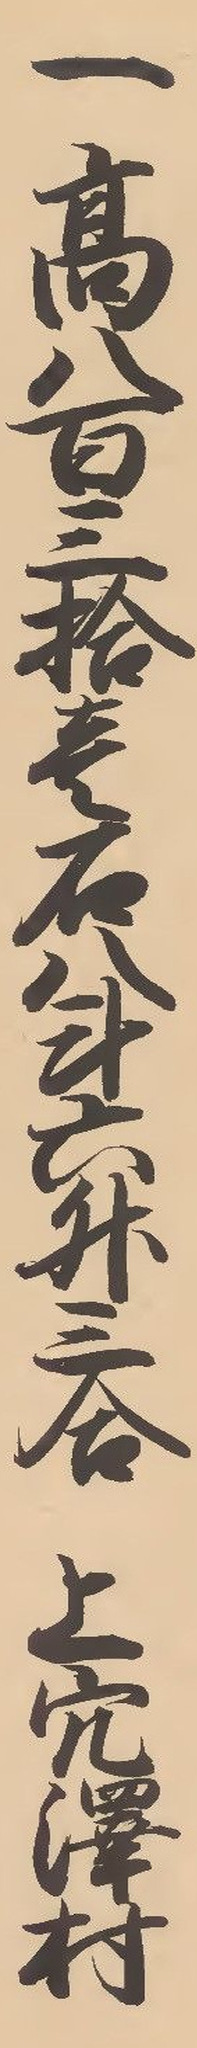一高八百三拾壱石八斗六升三合上穴沢村
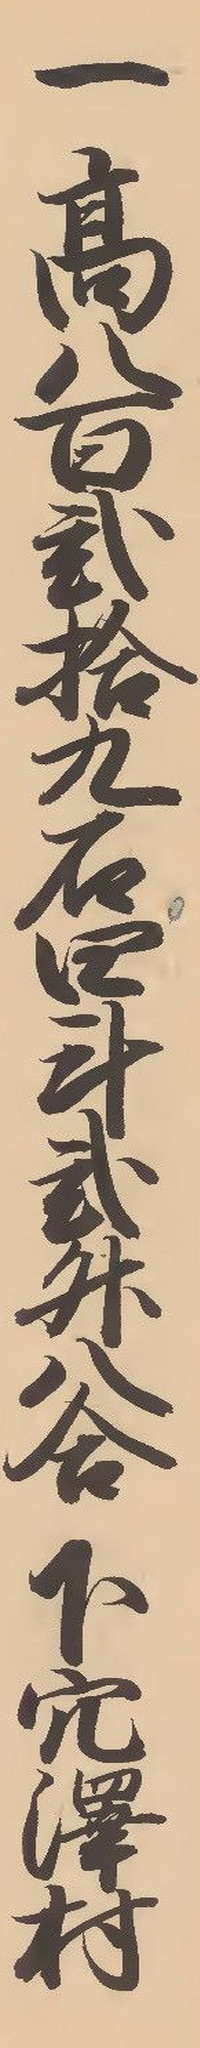一高八百弐拾九石四斗弐升八合下穴沢村
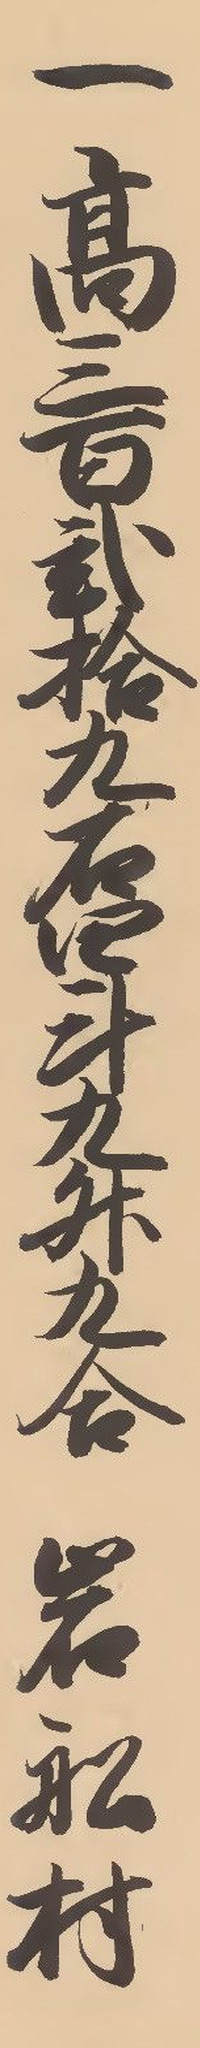一高三百弐拾石四斗九升九合岩船村

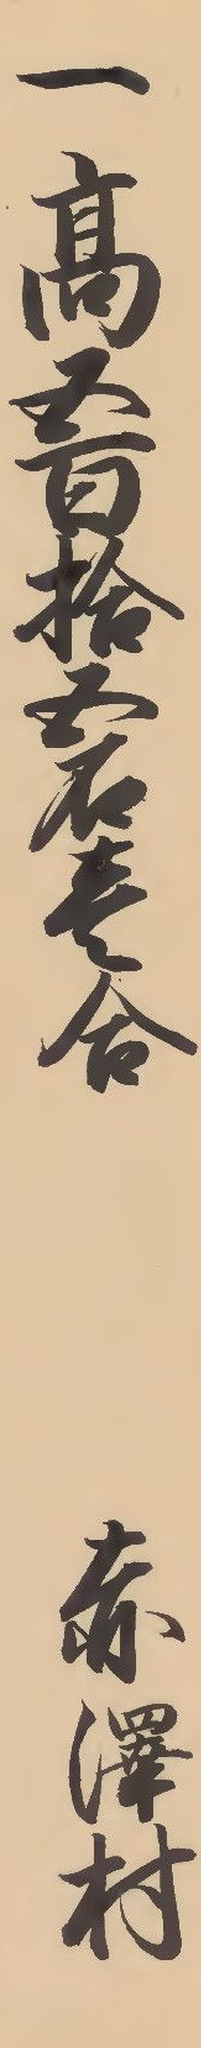一高五百拾五石壱合赤沢村
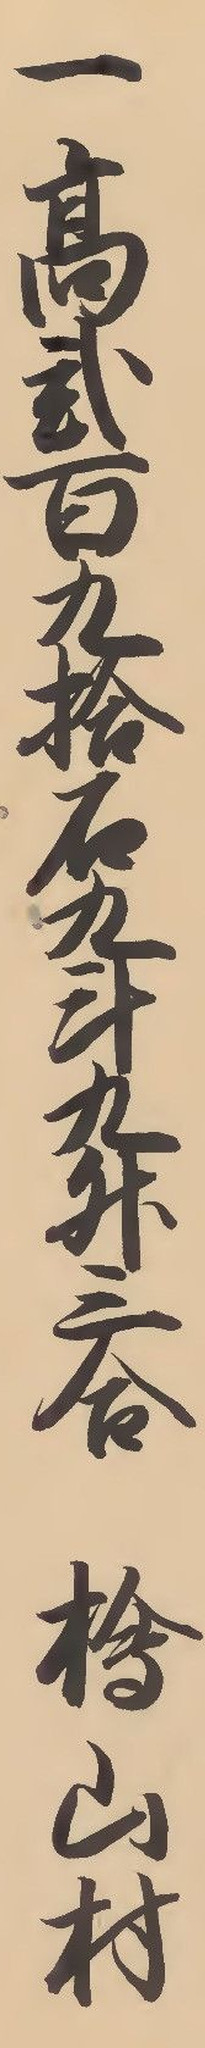一高弐百九拾石九斗九升三合檜山村
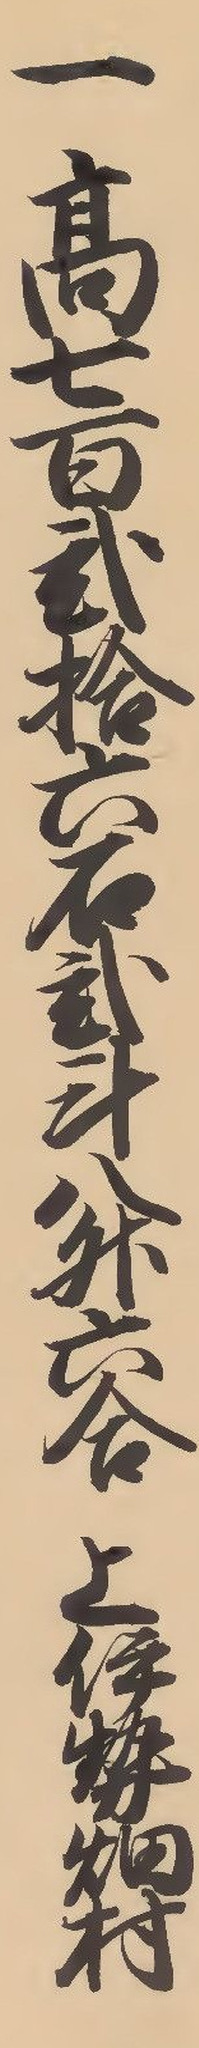一高七百弐拾六石弐斗八升六合上伊勢畑村
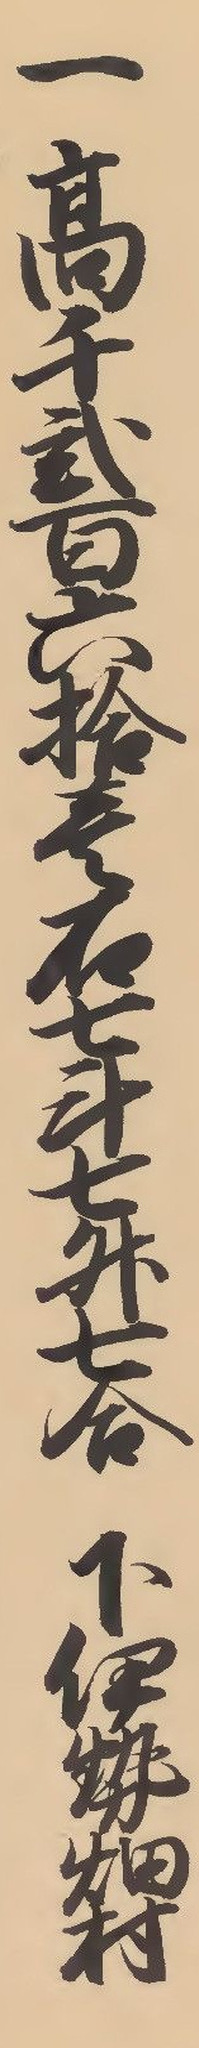一高千弐百六拾壱石七斗七升七合下伊勢畑村
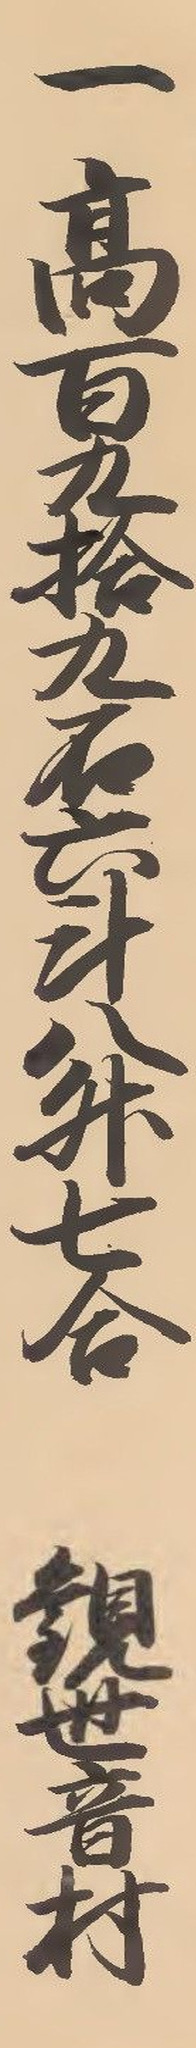一高百九拾九石六斗八升七合観世音村
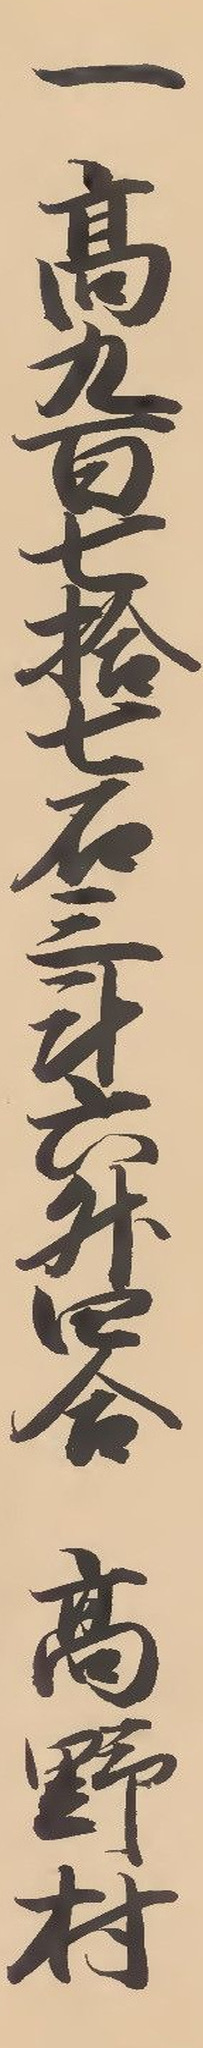一高九百七拾七石三斗六升四合高野村
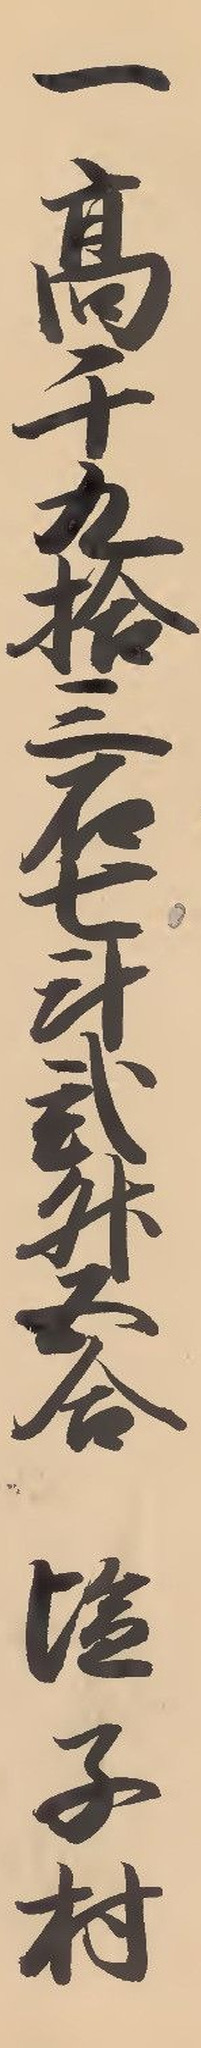一高千九拾三石七斗弐升五合塩子村
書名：常陸国郷帳
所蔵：国立公文書館 National Archives of Japan
